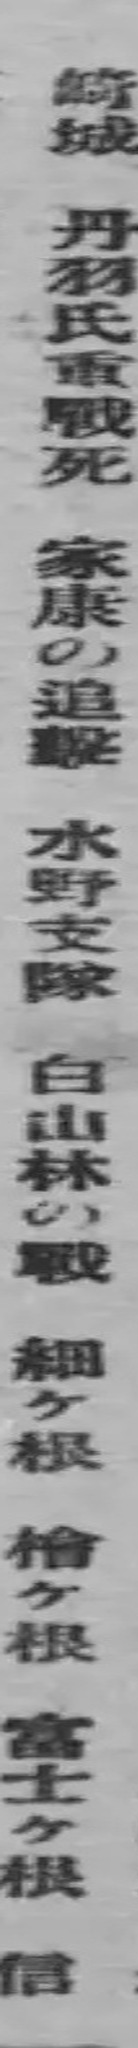崎城丹羽氏重戦死家康の追撃水野支援白山林の戦細ケ根檜ケ根富士ケ根信
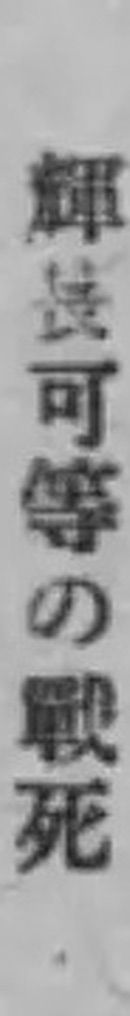輝長可等の戦死
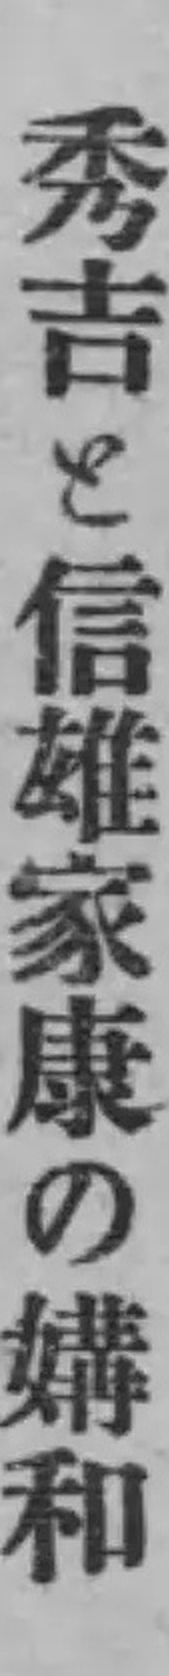秀吉と信雄家康の媾和
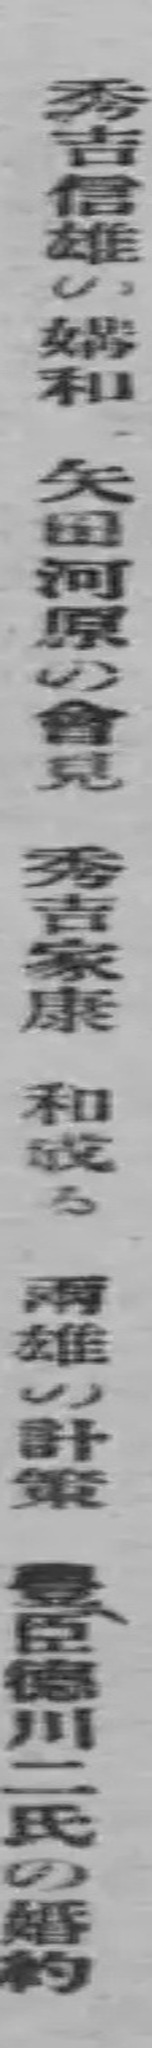秀吉信雄の媾和矢田河原の会見秀吉家康媾和成る両雄の計策豊臣徳川二氏の婚約
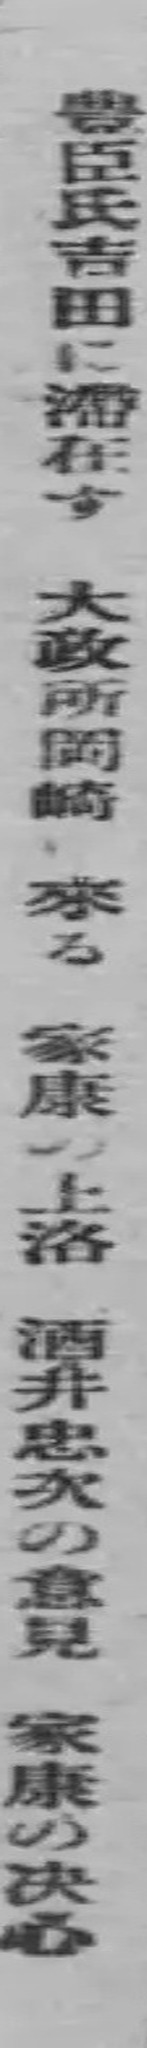豊臣氏吉田に滞在す大政所岡崎に来る家康の上洛酒井忠次の意見家康の決心
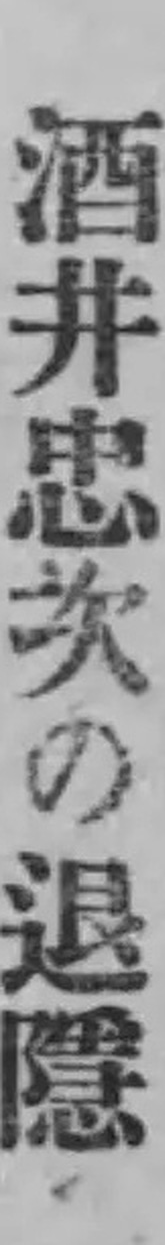酒井忠次の退隠
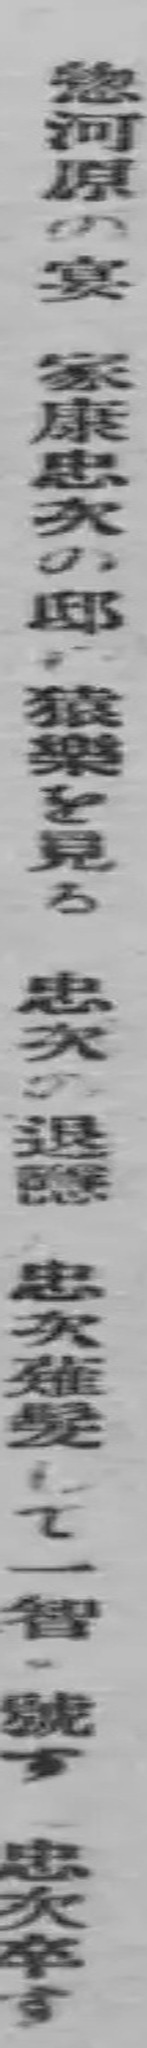惣河原の宴家康忠次の邸に猿楽を見る忠次の退隠忠次薙髪して一智と号す忠次卒す
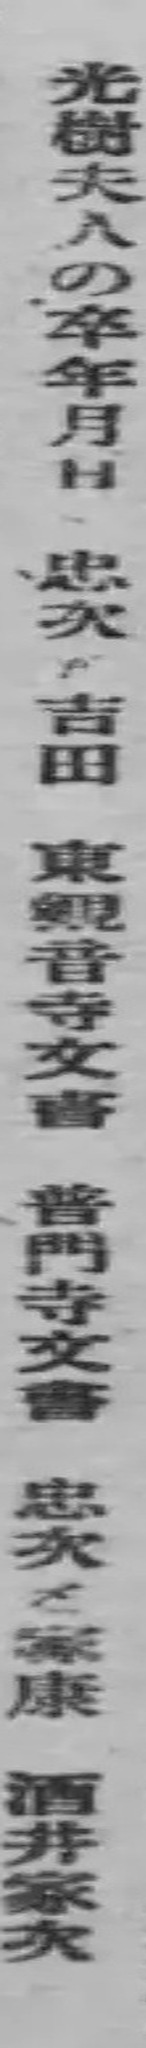光樹夫人の卒年月日忠次と吉田東観音寺文書普門寺文書忠次と家康酒井家次
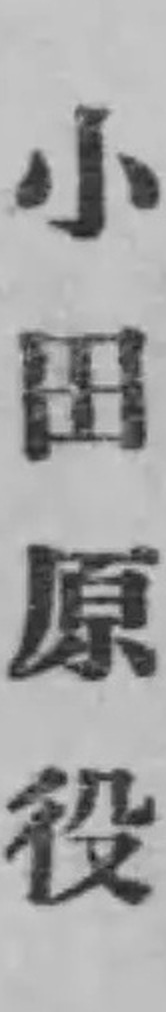小田原役
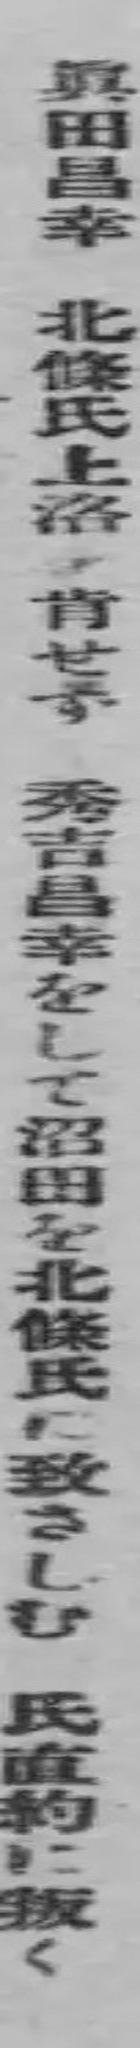真田昌幸北条氏上洛に肯せず秀吉昌幸をして沼田を北条氏に致さしむ氏直約に叛く
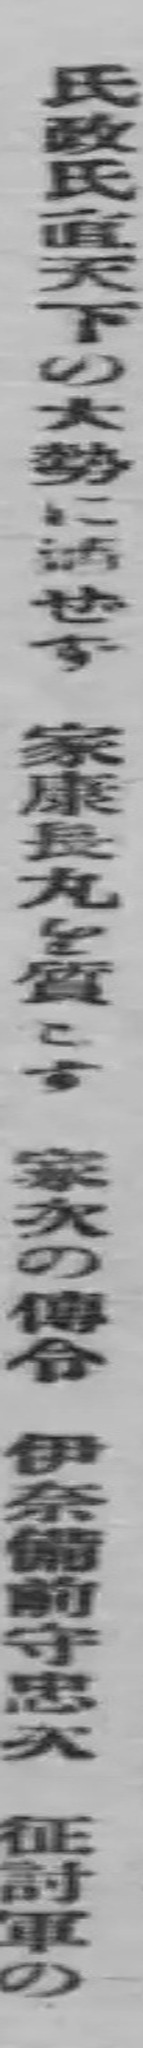氏政氏直天下の大勢に通ぜず家康長丸を質とす家次の伝令伊奈備前守忠次征討軍の
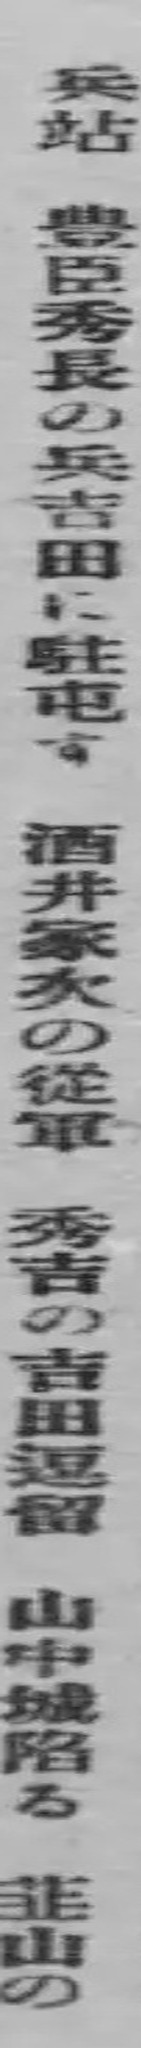兵站豊臣秀長の兵吉田に駐屯す酒井家次の従軍秀吉の吉田逗留山中城陥る韮山の
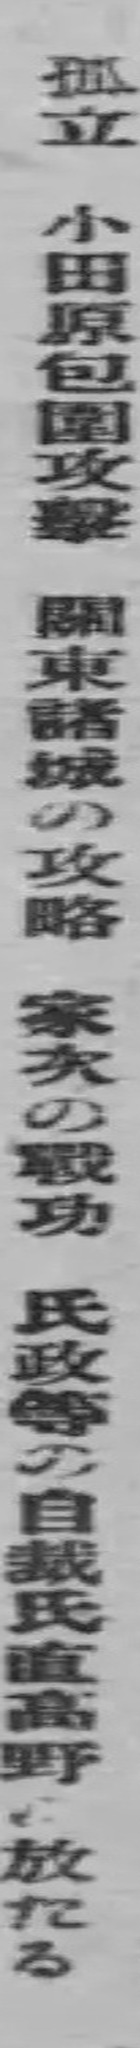孤立小田原包囲攻撃関東諸城の攻略家次の戦功氏政等の自裁氏直高野に放たる
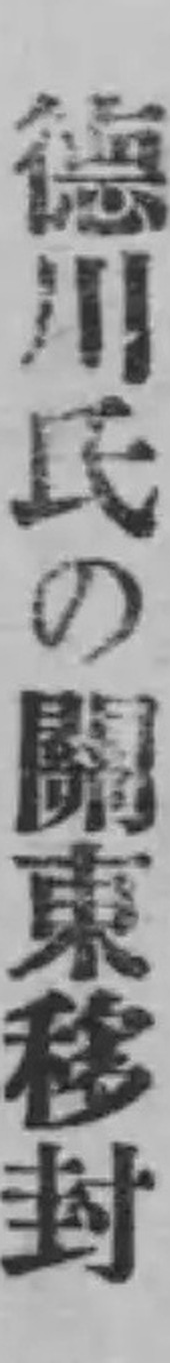徳川氏の関東移封
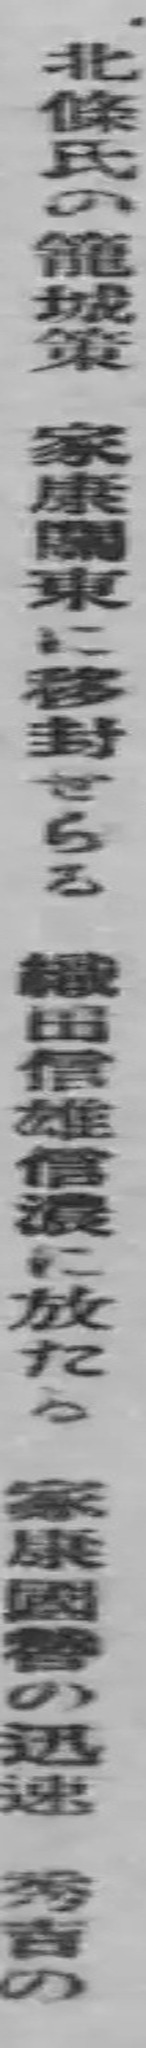北条氏の籠城策家康関東に移封せらる織田信雄信濃に放たる家康国替の迅速秀吉の
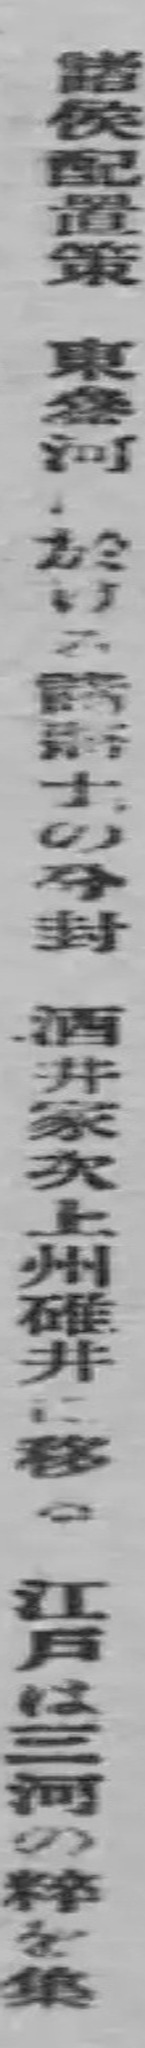諸侯配置策東参河に於ける諸将士の分封酒井家次上州碓井に移る江戸は三河の粋を集
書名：豊橋市史談
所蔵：国立国会図書館 National Diet Library, JAPAN
